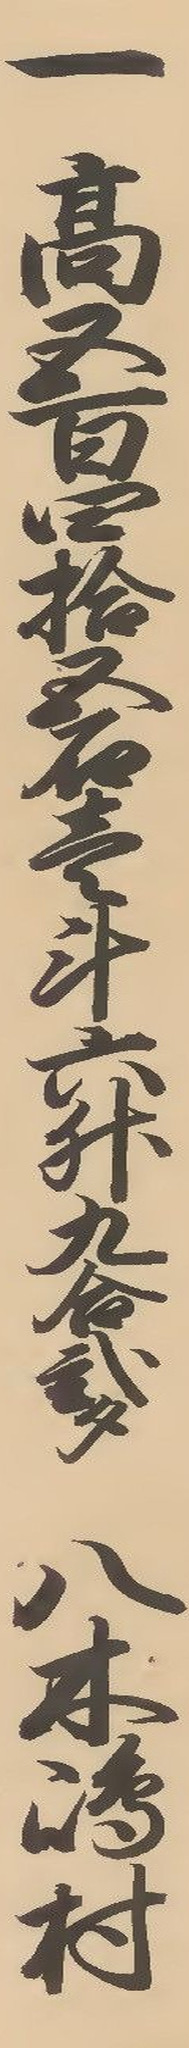一高五百四拾五石壱斗六升九合弐勺八木島村
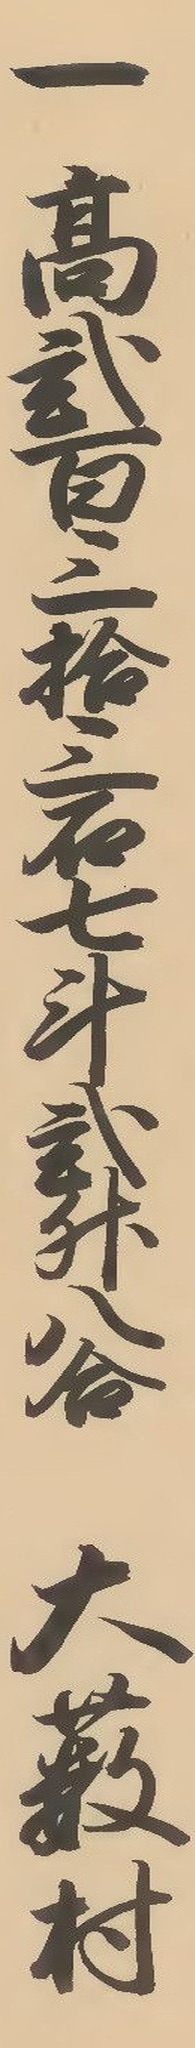一高弐百三拾三石七斗弐升八合大薮村
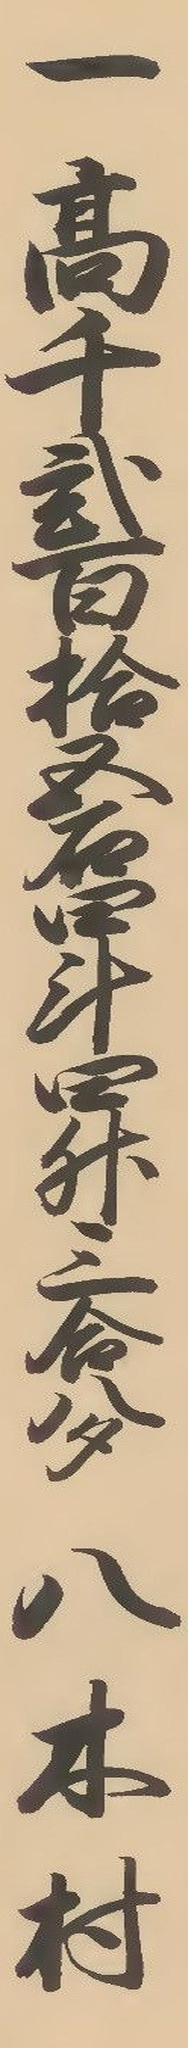一高千弐百拾五石四斗四升三合八勺八木村

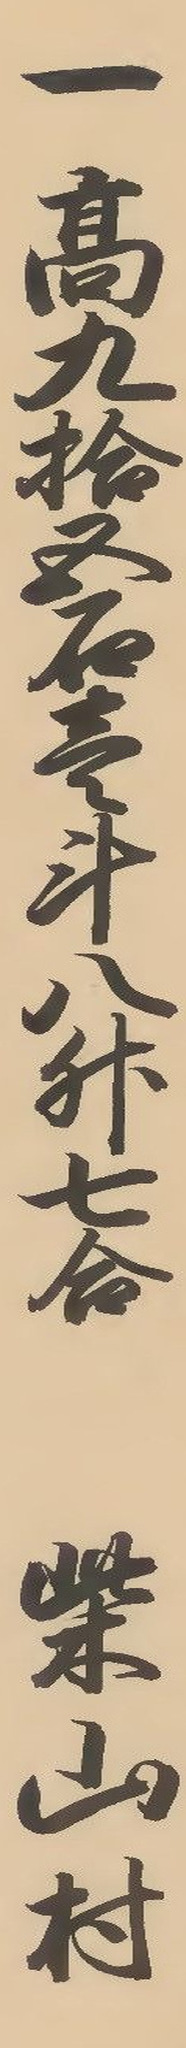一高九拾五石壱斗八升七合柴山村
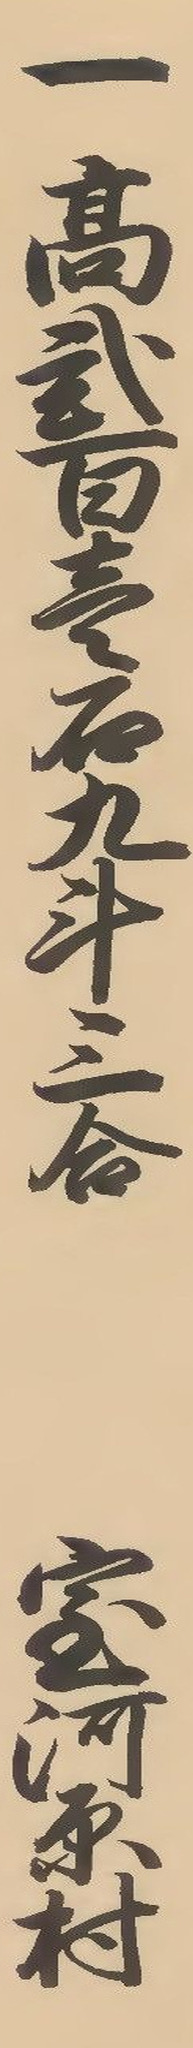一高弐百壱石九斗三合室河原村
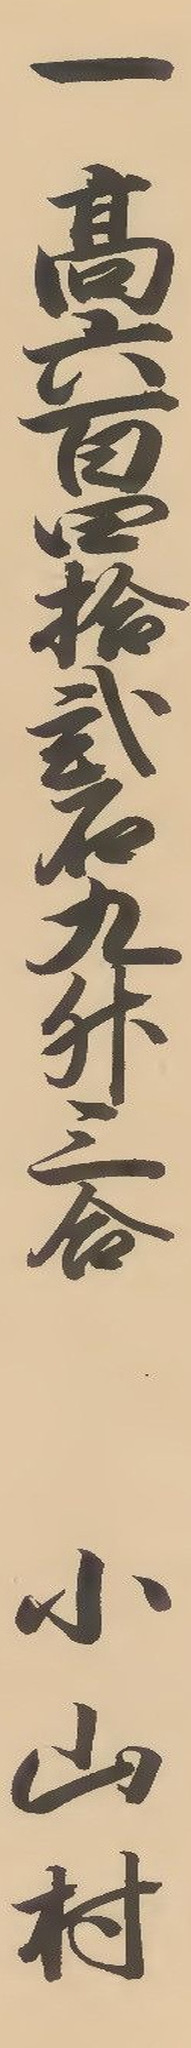一高六百四拾弐石九升三合小山村
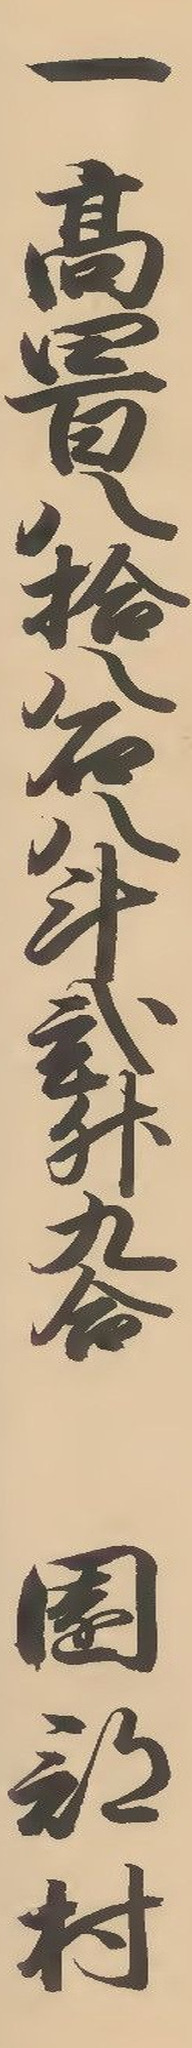一高四百八拾八石八斗弐升九合園部村
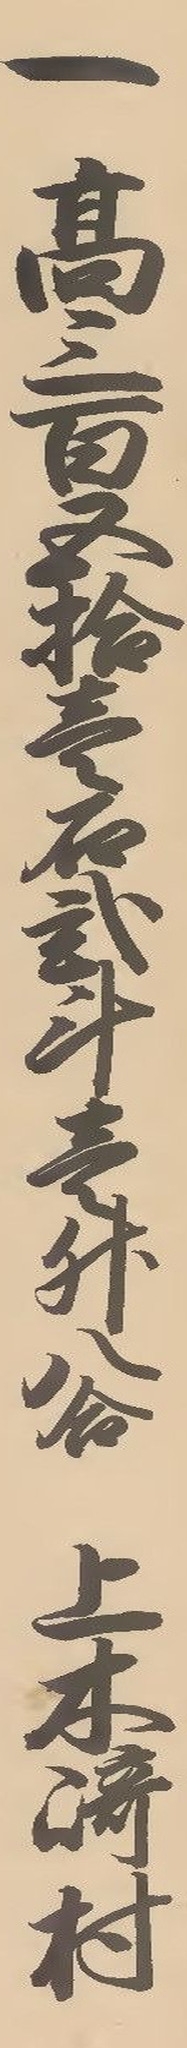一高三百五拾壱石弐斗壱升八合上木崎村
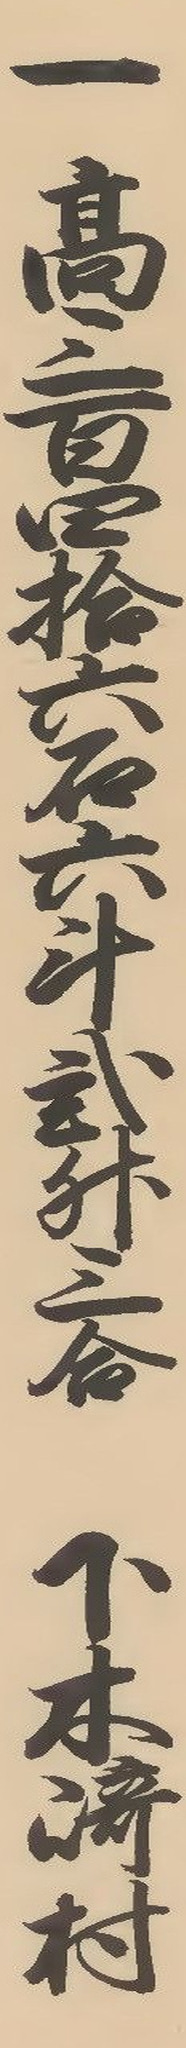一高三百四拾六石六斗弐升三合下木崎村
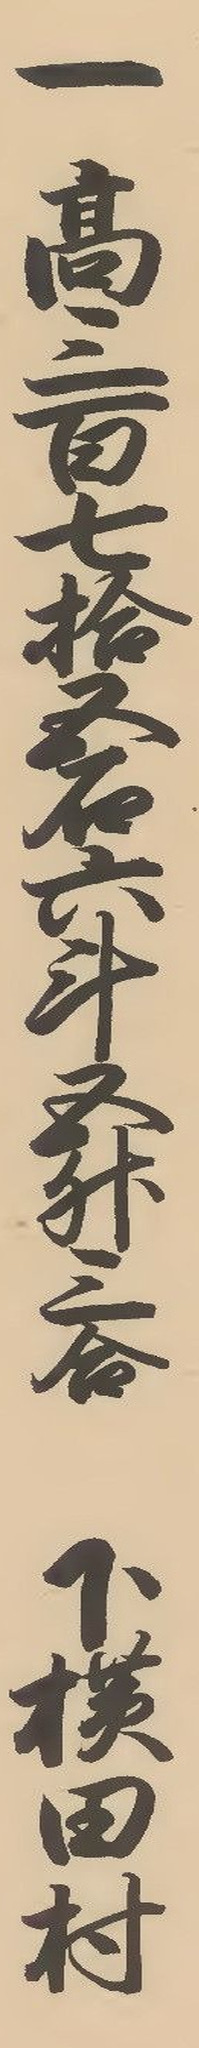一高三百七拾五石六斗五升三合下横田村
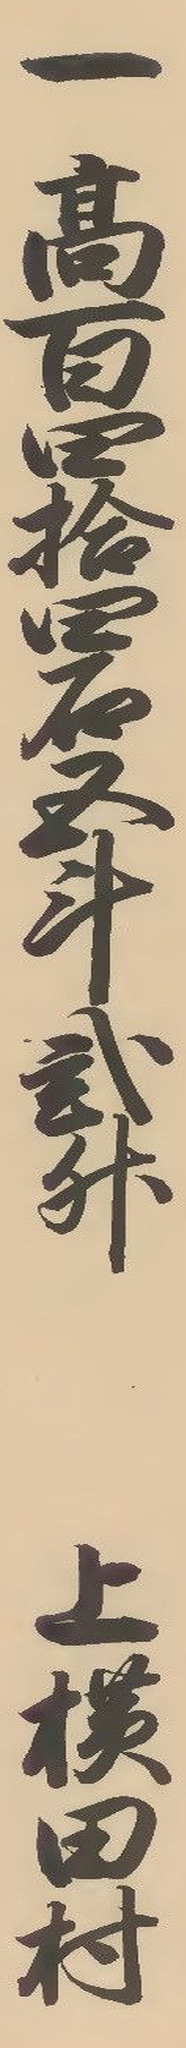一高百四拾四石五斗弐升上横田村

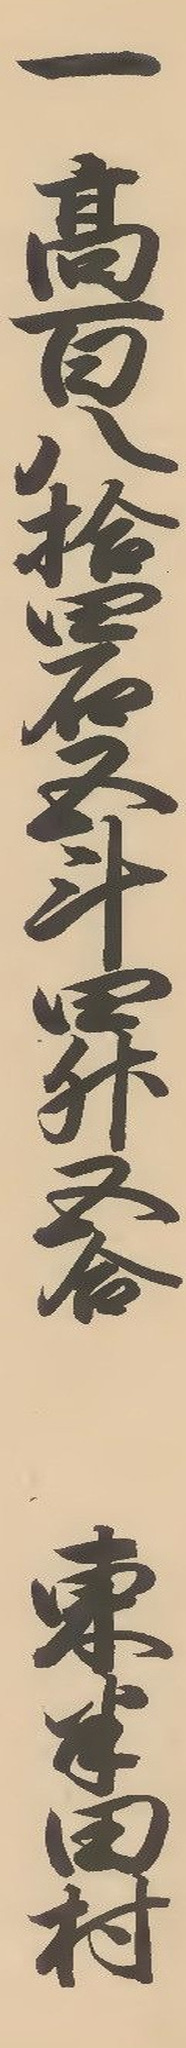一高百八拾四石五斗四升五合東半田村
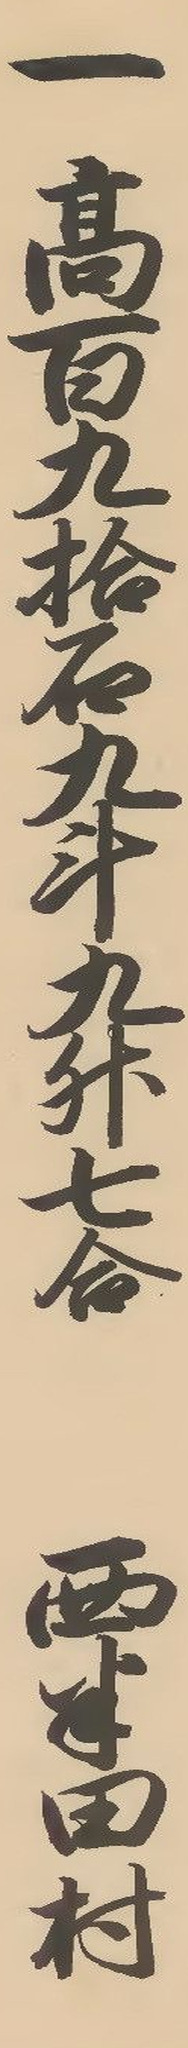一高百九拾石九斗九升七合西半田村
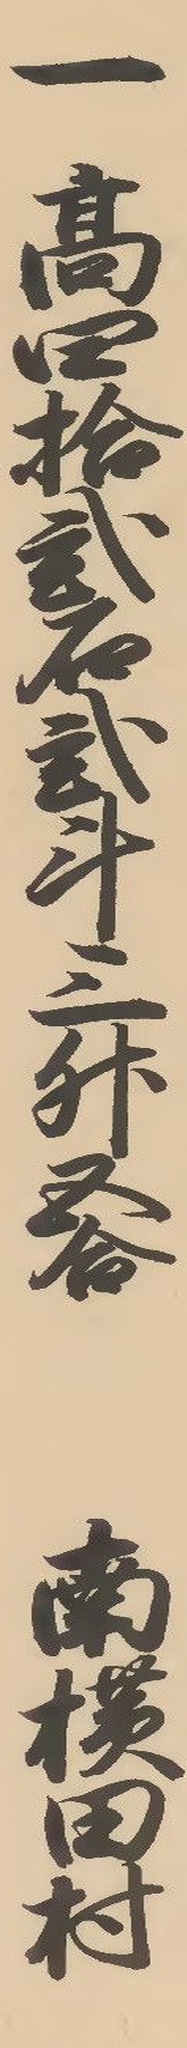一高四拾弐石弐斗三升五合南横田村
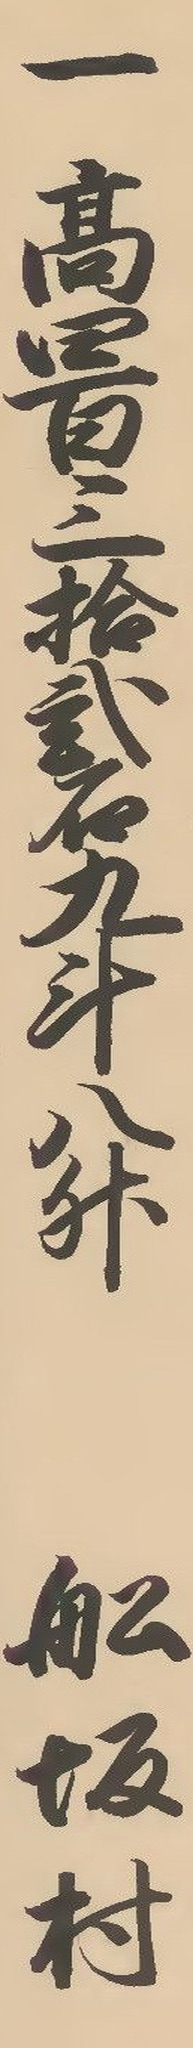一高四百三拾弐石九斗八升船坂村
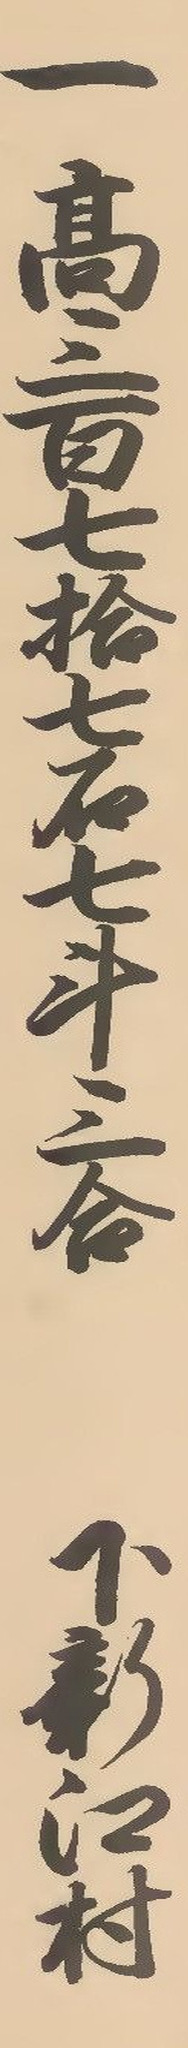一高三百七拾七石七斗三合下新江村
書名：丹波国郷帳
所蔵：国立公文書館 National Archives of Japan
